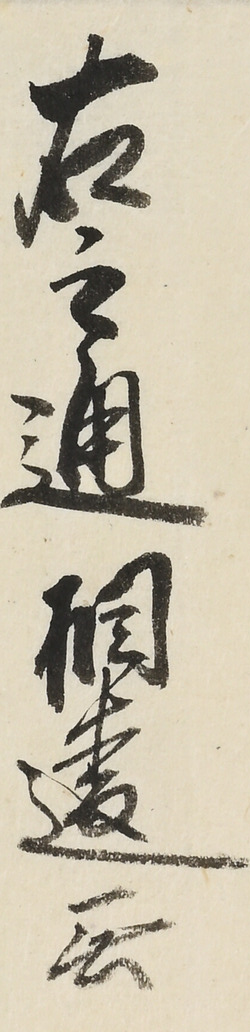右之通相違無
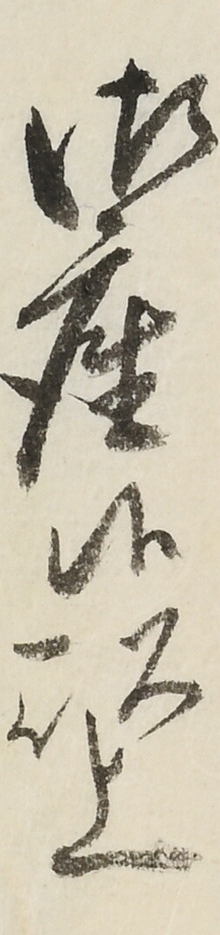御座候以上

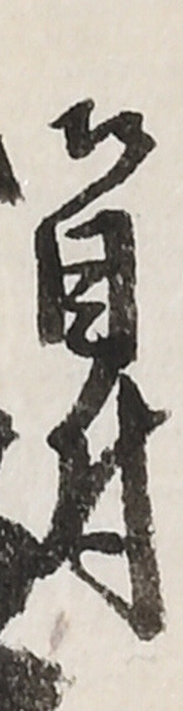御目付
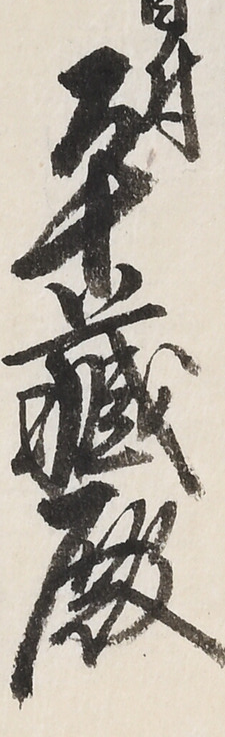平蔵殿
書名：安政六己未年二月石切名前書上帳
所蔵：伊那市立高遠町図書館・合同会社AMANE
